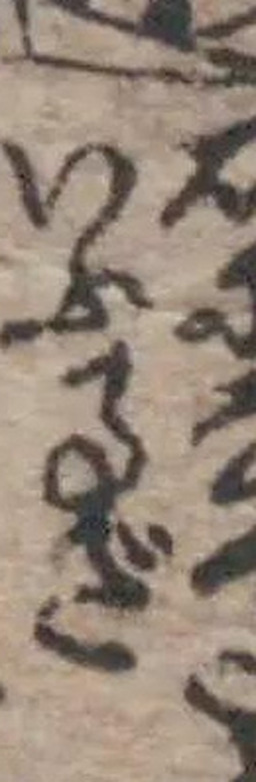いふ事だ
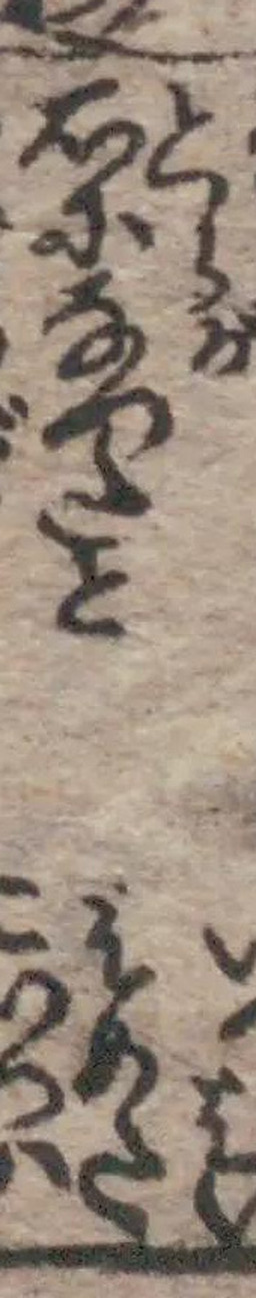石になつたと
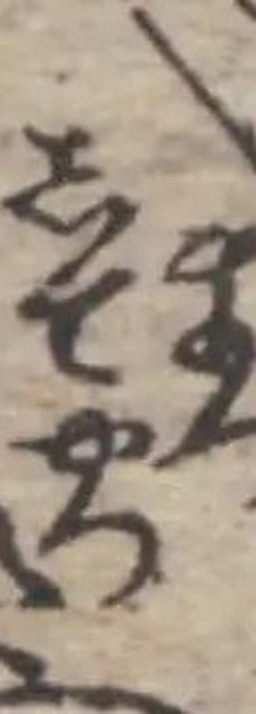してやつた
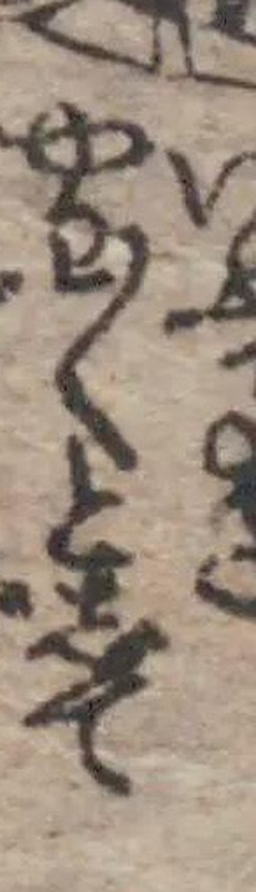やわ〳〵として
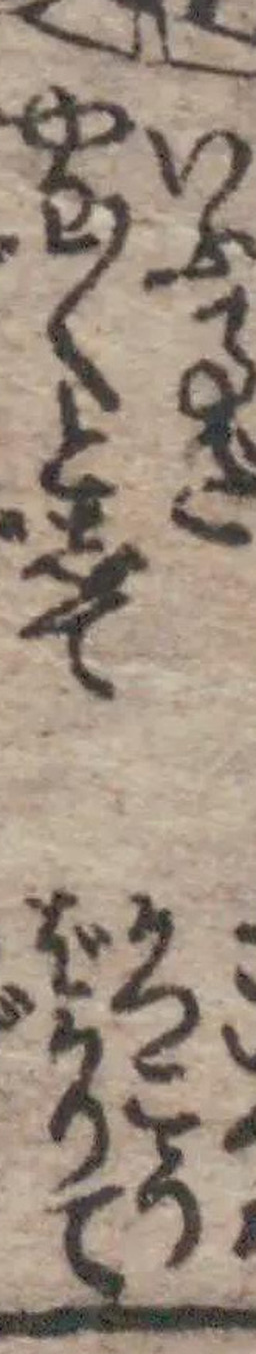やわ〳〵として
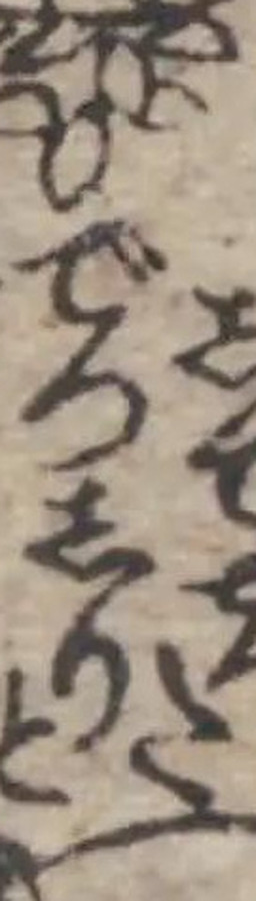でつしりと
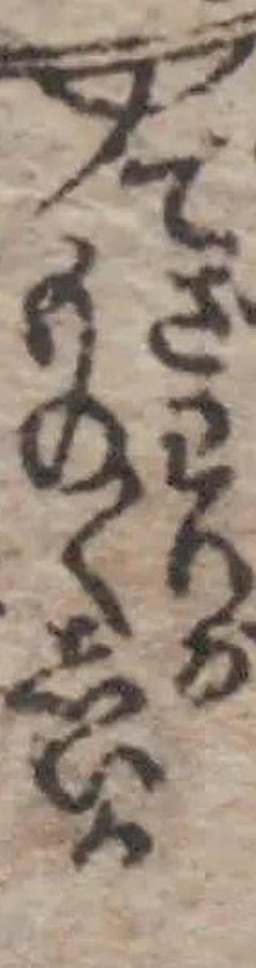もの〳〵しいか
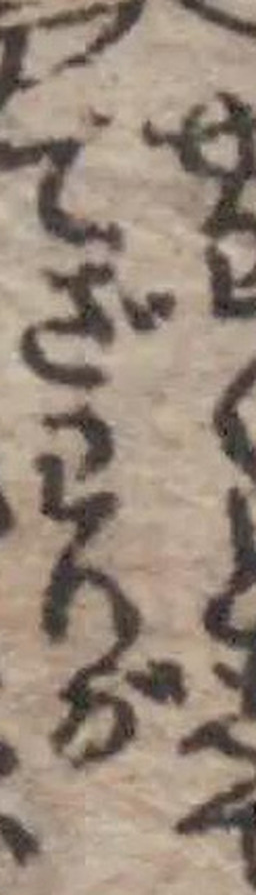てざわりが
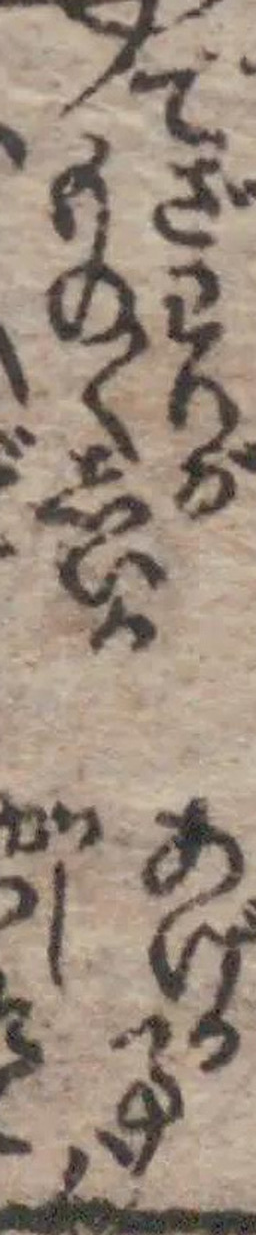もの〳〵しいか
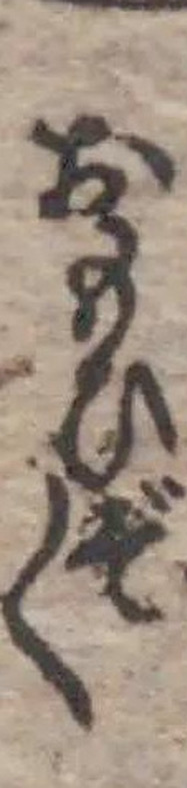おもひぞ
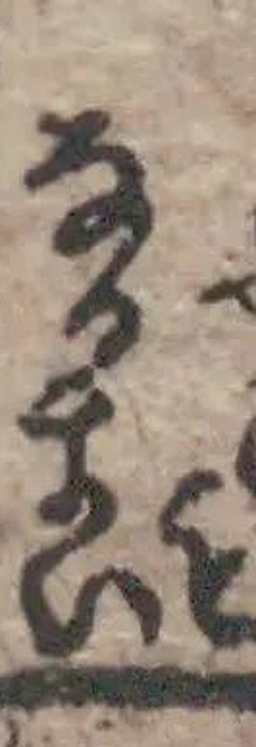なるまい
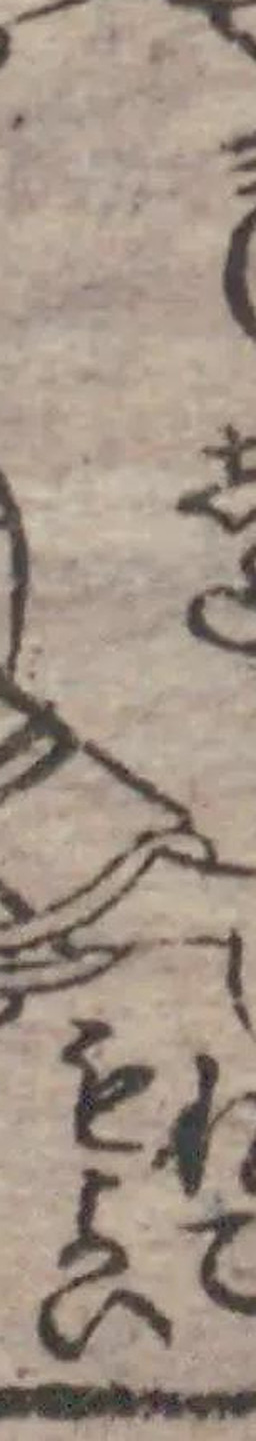もよい
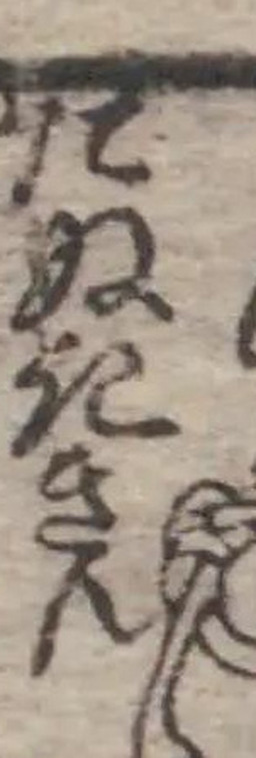たぬききん
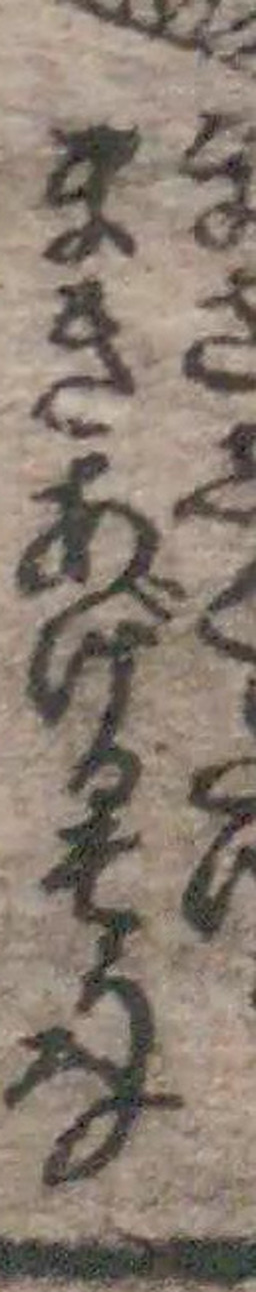まきあげるそうな

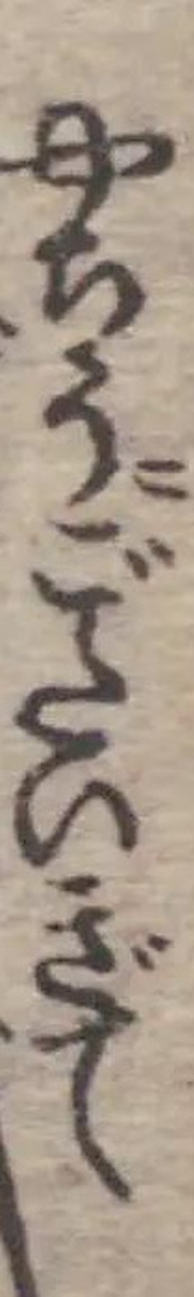やちうごたいぎて
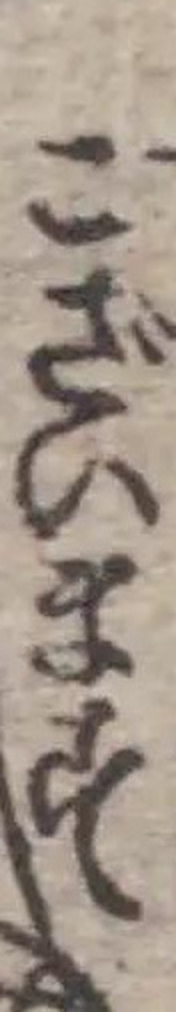こざいます
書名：大磯地蔵咄 2巻
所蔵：国立国会図書館 National Diet Library, JAPAN
